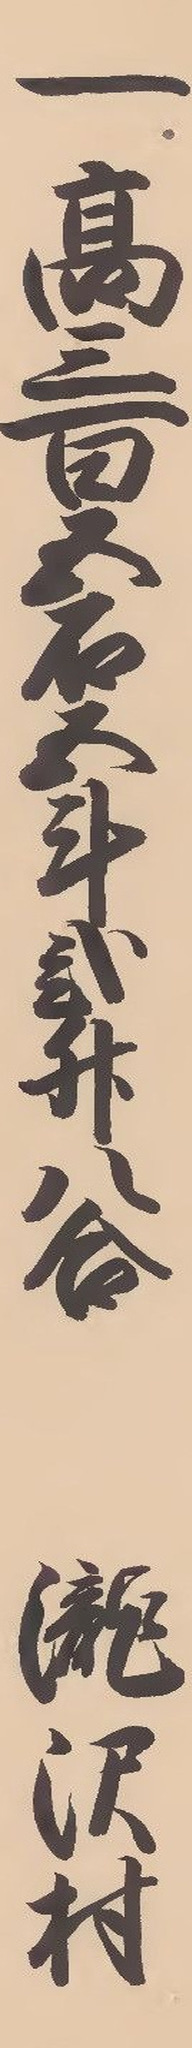一高三百五石五斗弐升八合滝沢村
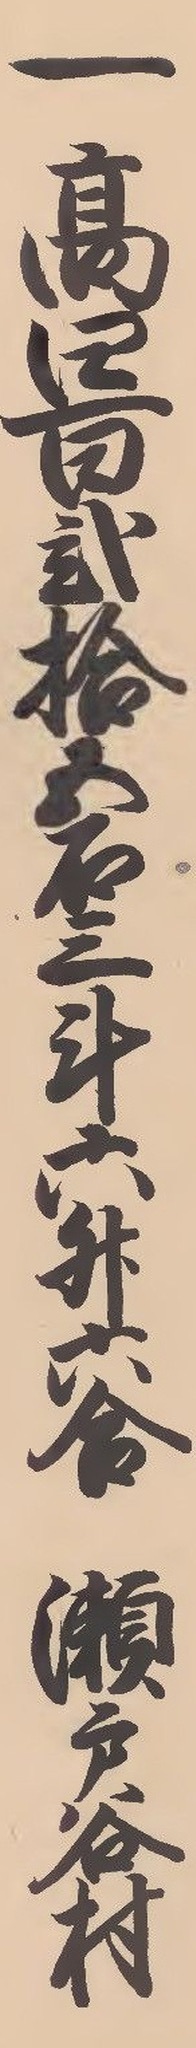一高四百弐拾五石三斗六升六合瀬戸谷村
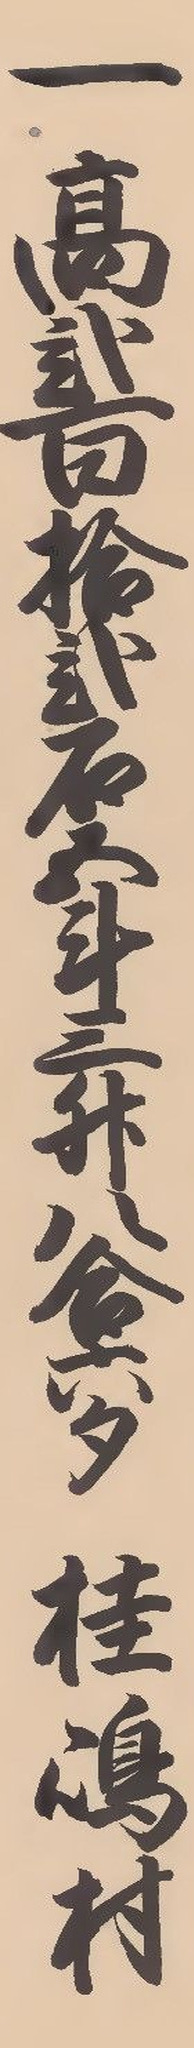一高弐百拾弐石五斗三升八合六勺桂島村
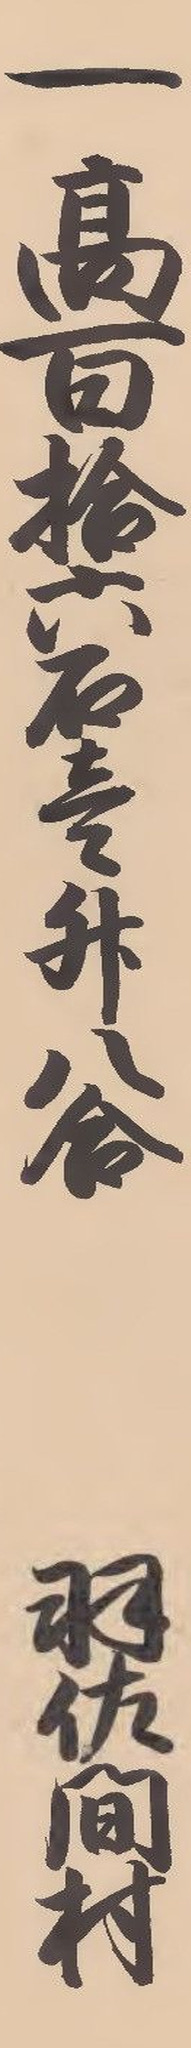一高百拾六石壱升八合羽佐間村
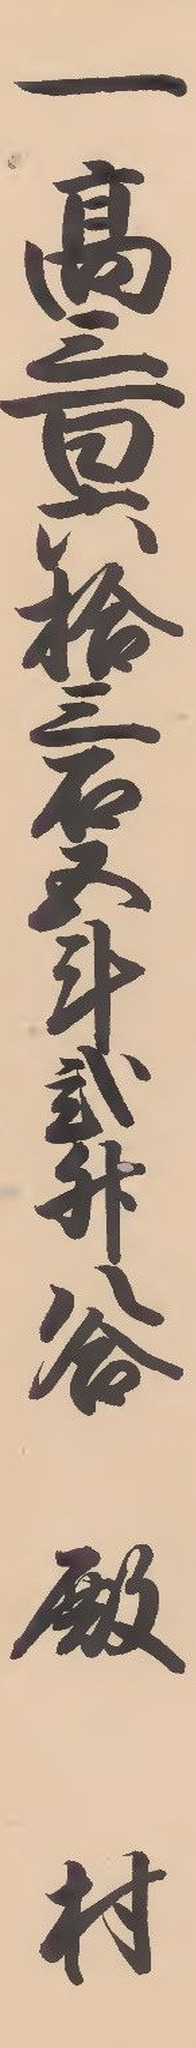一高三百六拾三石五斗弐升八合殿村

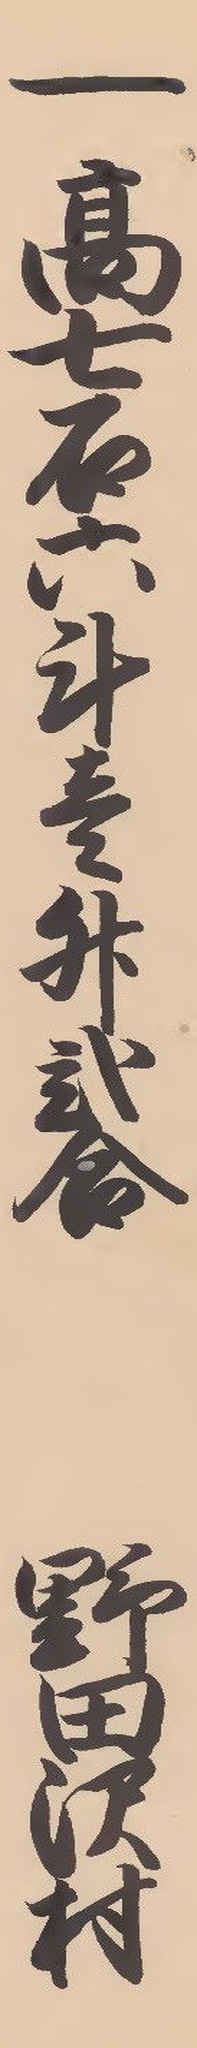一高七石六斗壱升弐合野田沢村
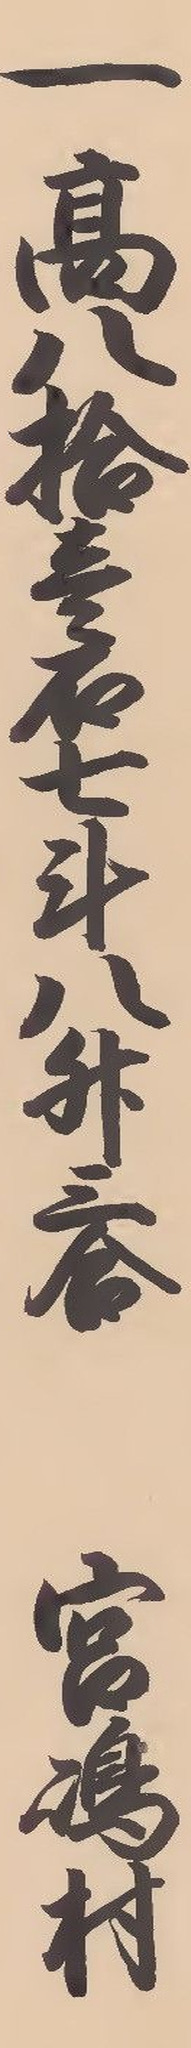一高八拾壱石七斗八升三合宮島村
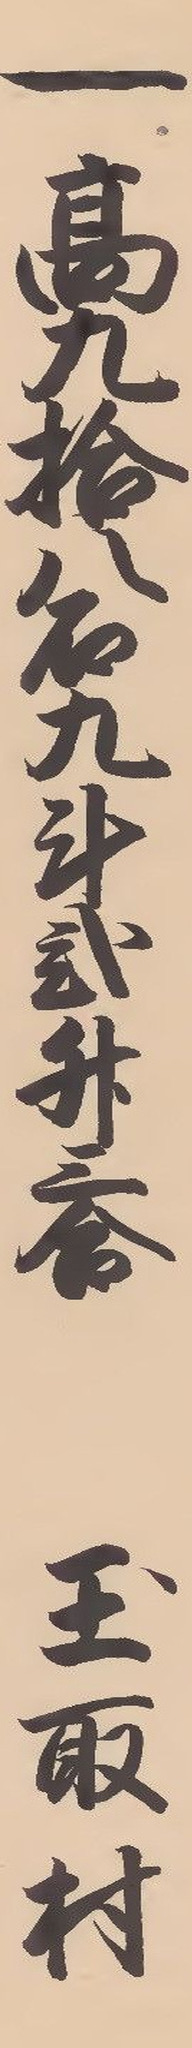一高九拾八石九斗弐升三合玉取村
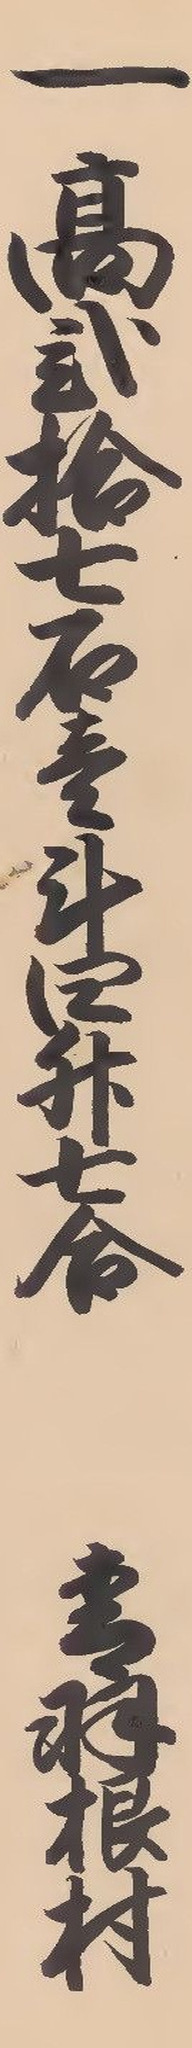一高弐拾七石壱斗四升七合青羽根村
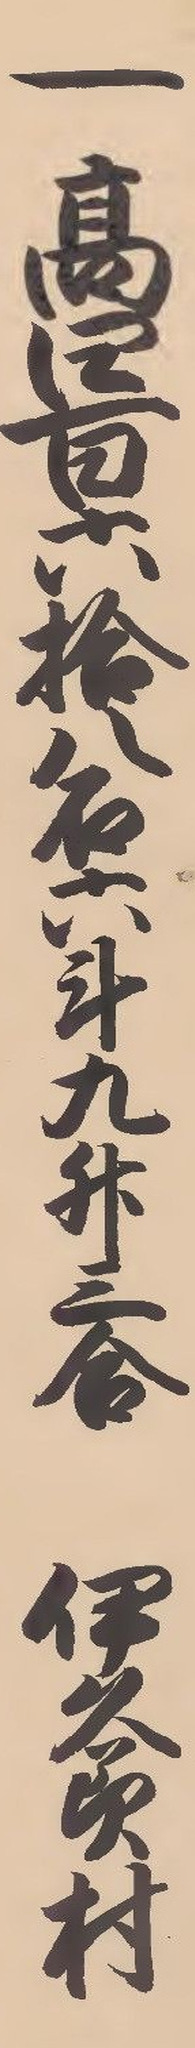一高四百六拾八石六斗九升三合伊久美村
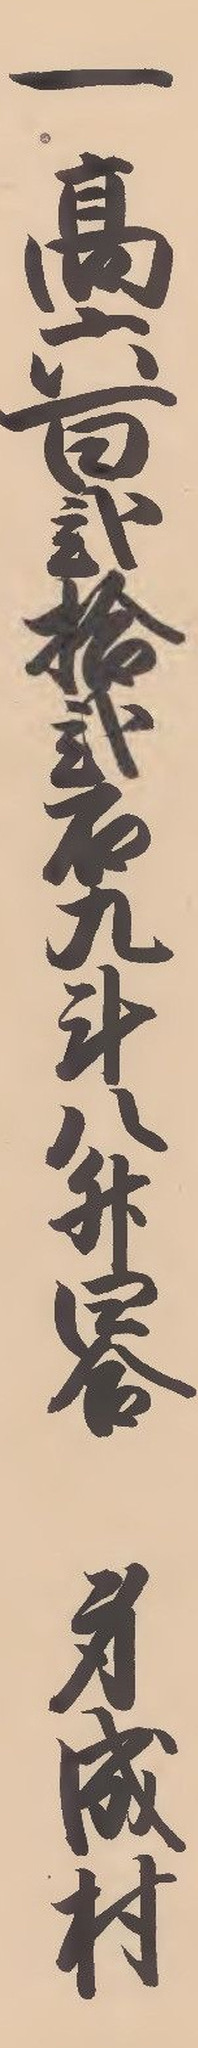一高六百弐拾弐石九斗八升四合身成村
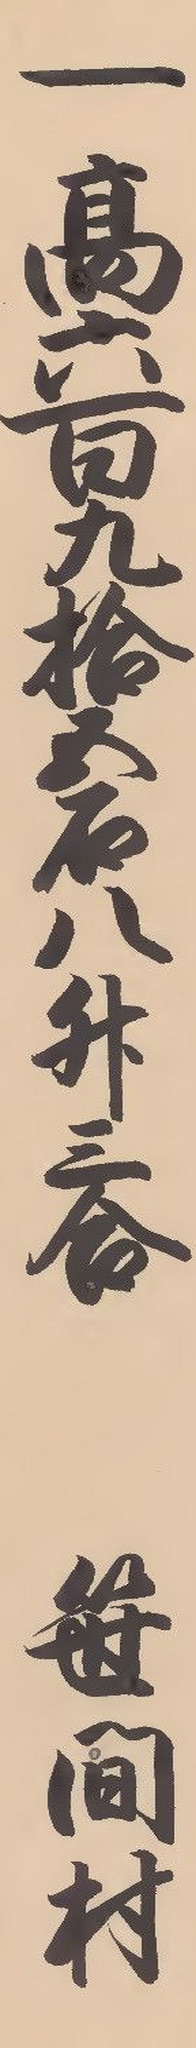一高六百九拾五石八升三合笹間村
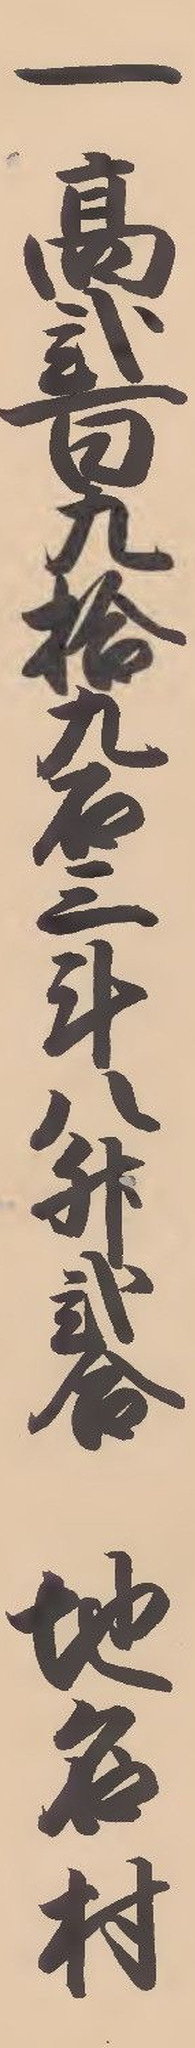一高弐百九拾九石三斗八升弐合地名村

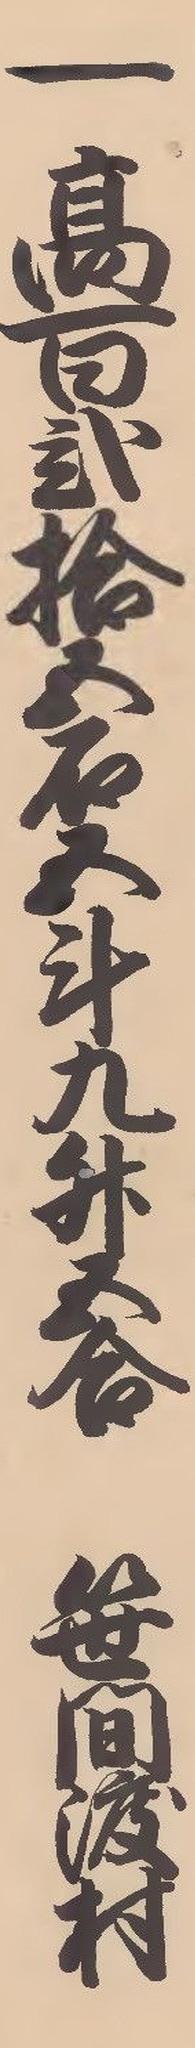一高百弐拾五石五斗九升五合笹間渡村
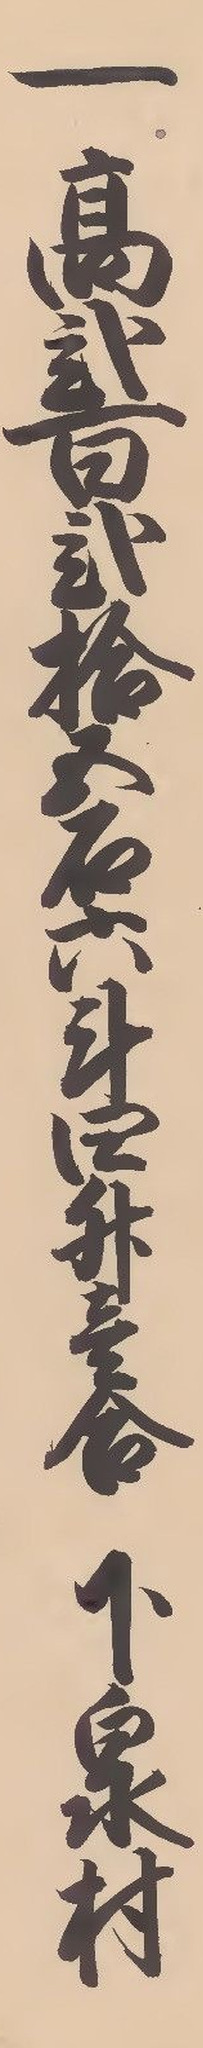一高弐百弐拾五石六斗四升壱合下泉村
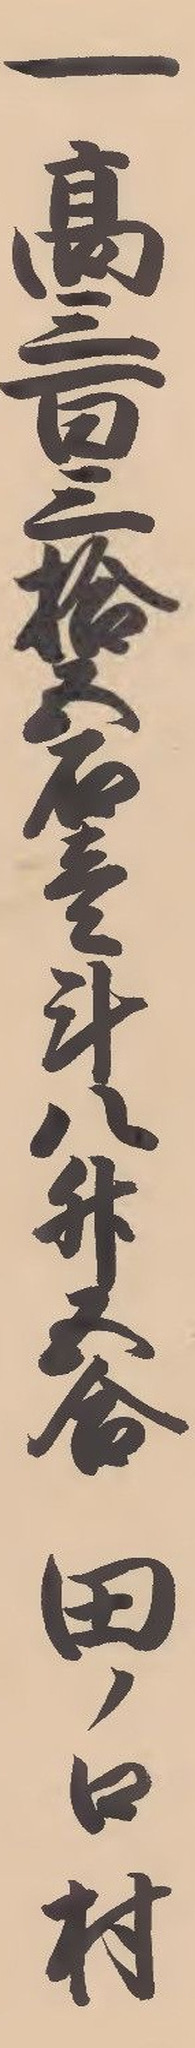一高三百三拾五石壱斗八升五合田ノ口村
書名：駿河国郷帳
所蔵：国立公文書館 National Archives of Japan
